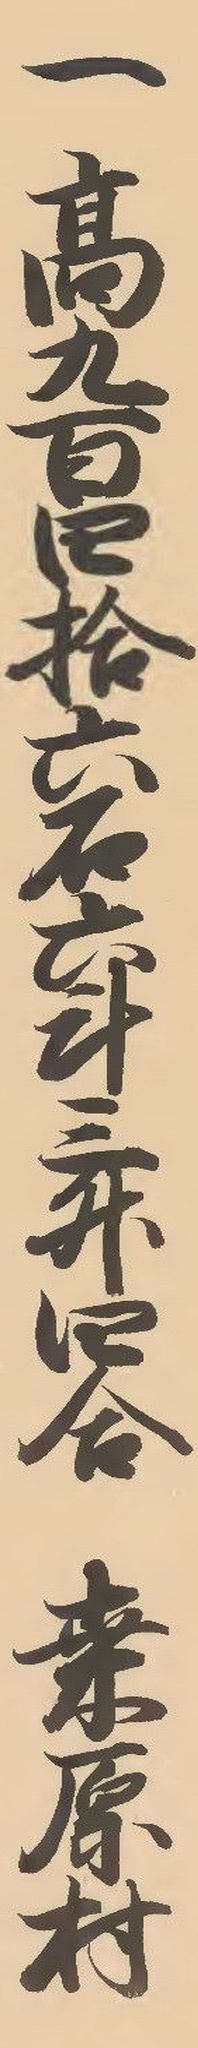一高九百四拾六石六斗三升四合桑原村
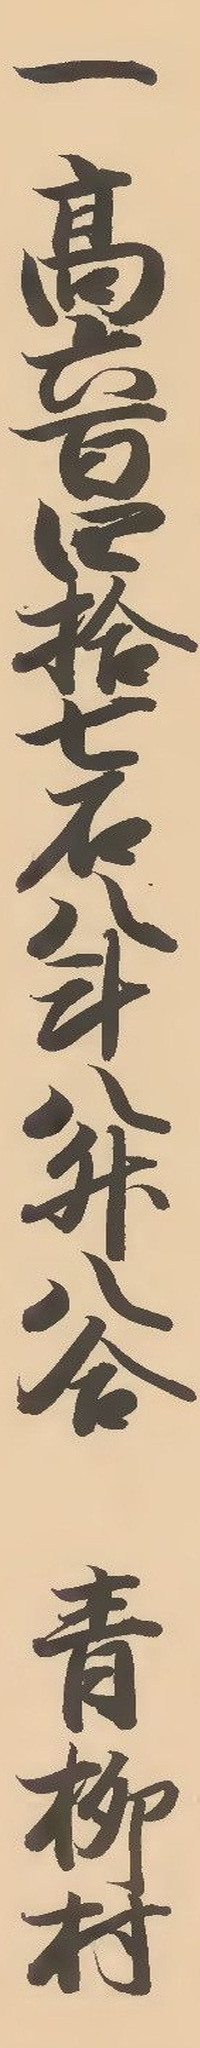一高六百四拾七石八斗八升八合青柳村
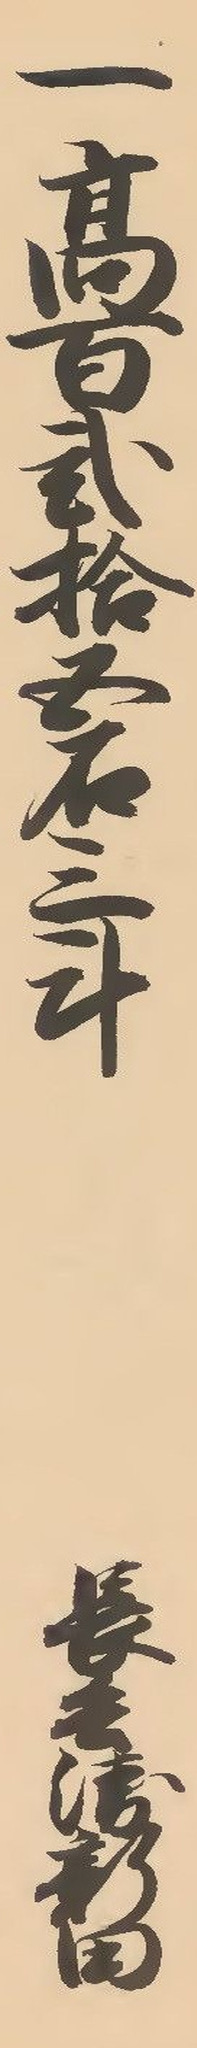一高百弐拾五石三斗長兵衛新田
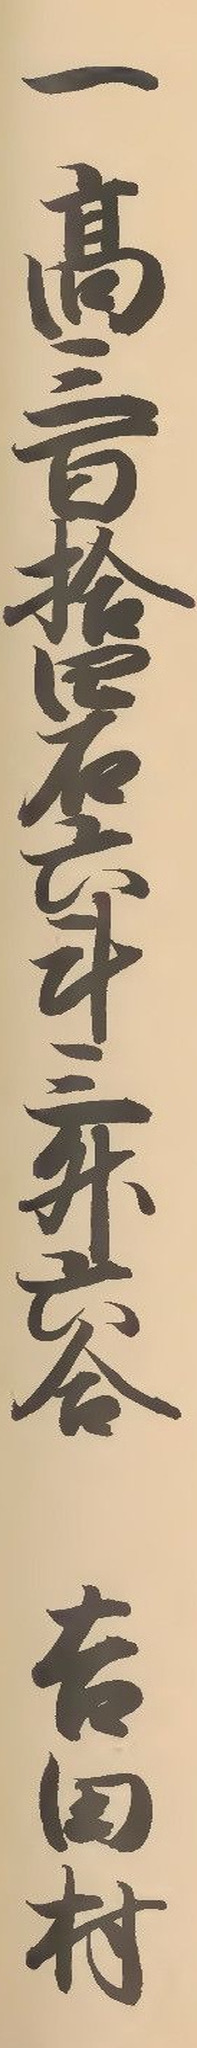一高三百拾四石六斗三升六合吉田村
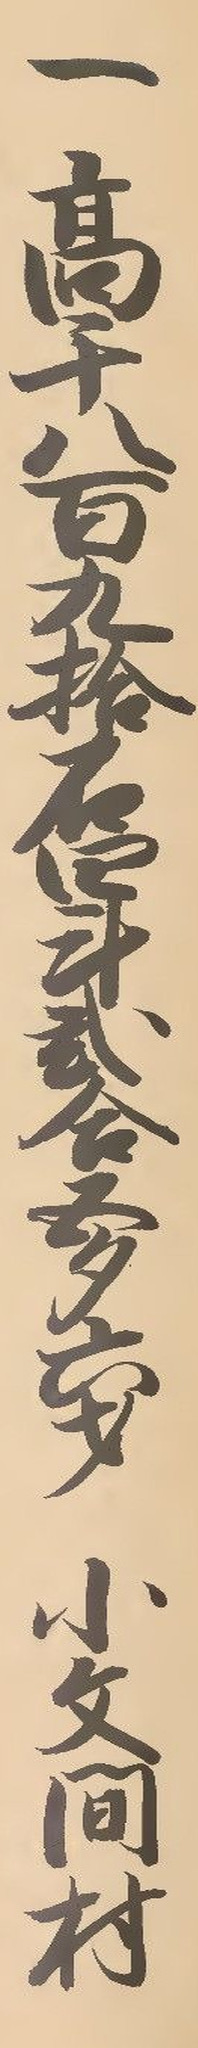一高千八百九拾石四斗弐合五勺六才小文間村
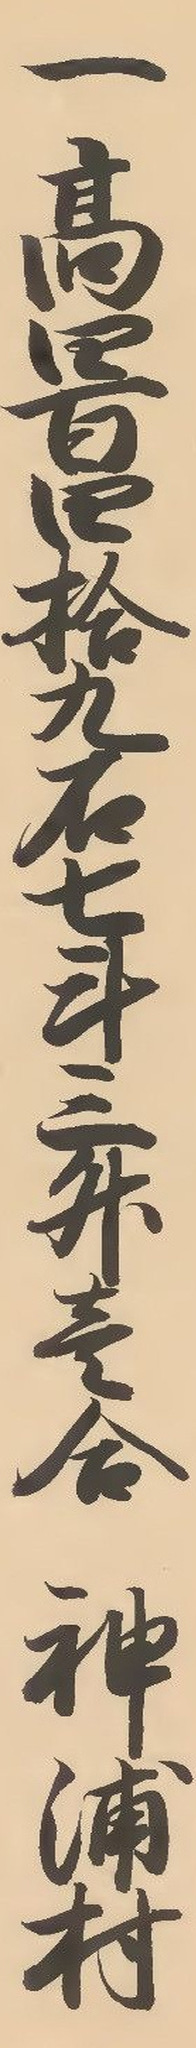一高四百四拾九石七斗三升壱合神浦村
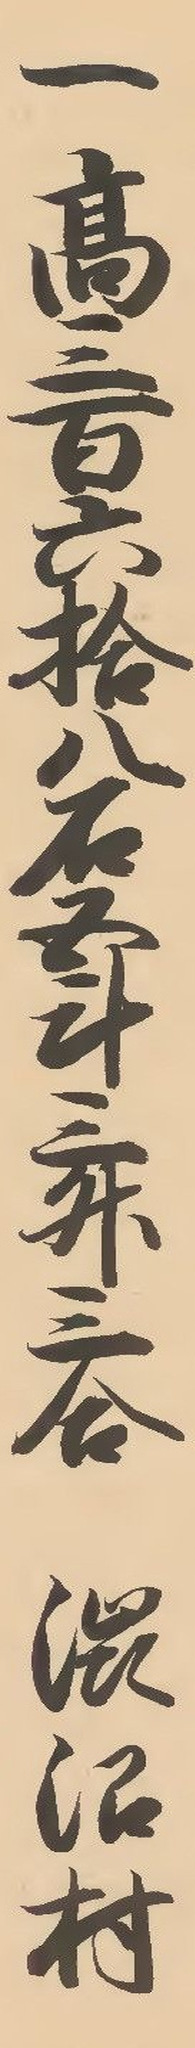一高三百六拾八石五斗三升三合渋沼村
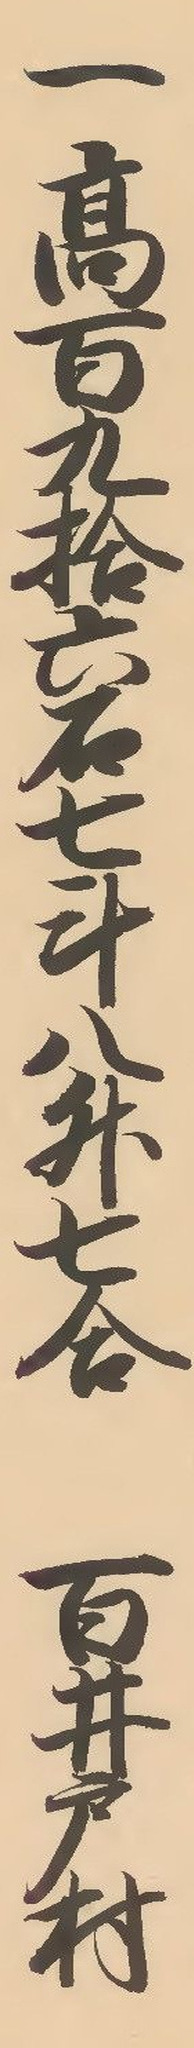一高百九拾六石七斗八升七合百井戸村

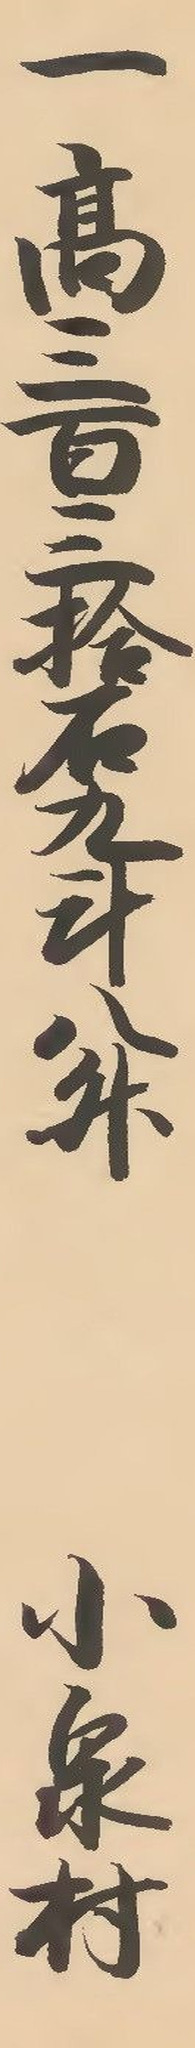一高三百三拾石九斗八升小泉村
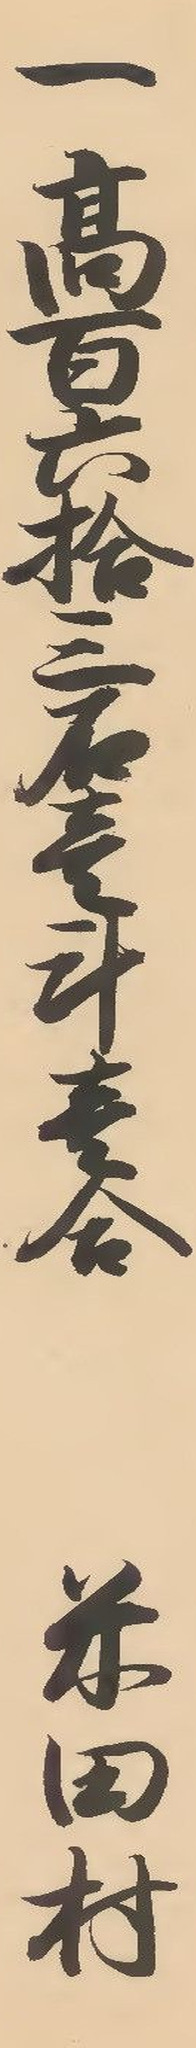一高百六拾三石壱斗壱合米田村
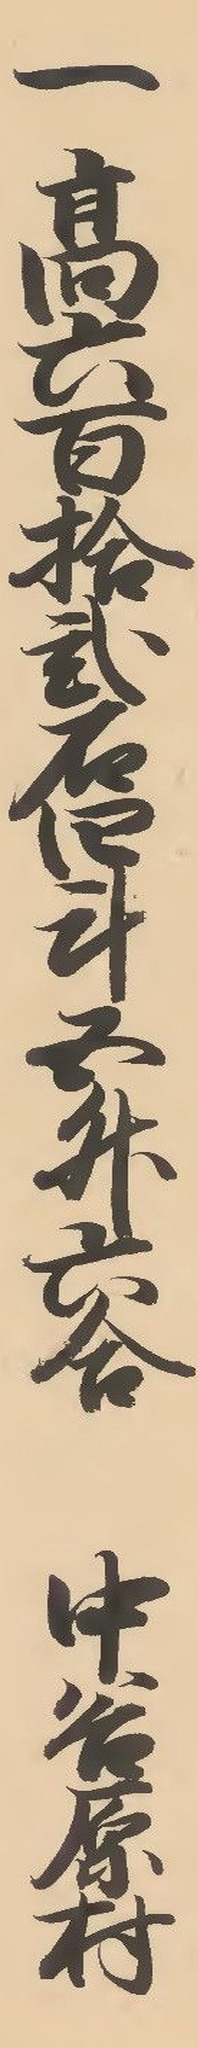一高六百拾弐石四斗五升六合中谷原村
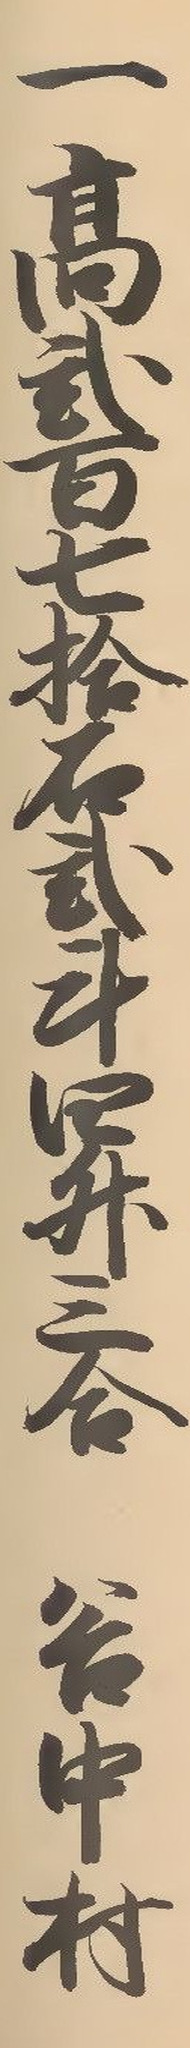一高弐百七拾石弐斗四升三合谷中村
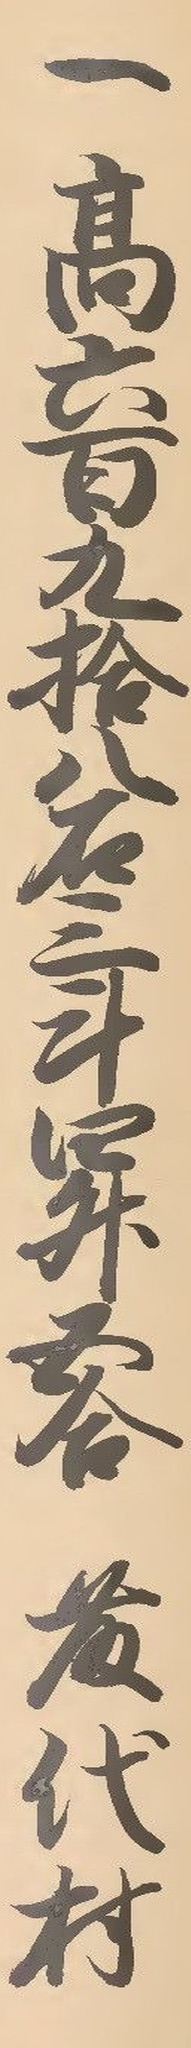一高六百九拾八石三斗四升五合藤代村
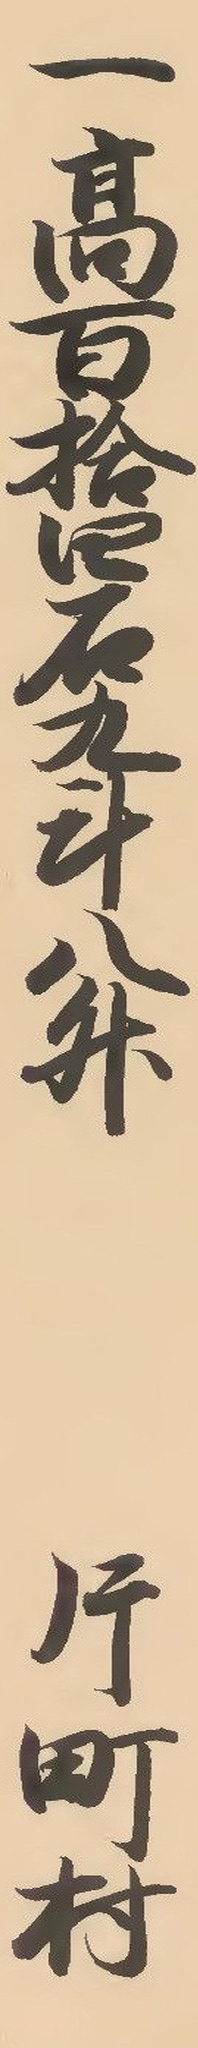一高百拾四石九斗八升片町村
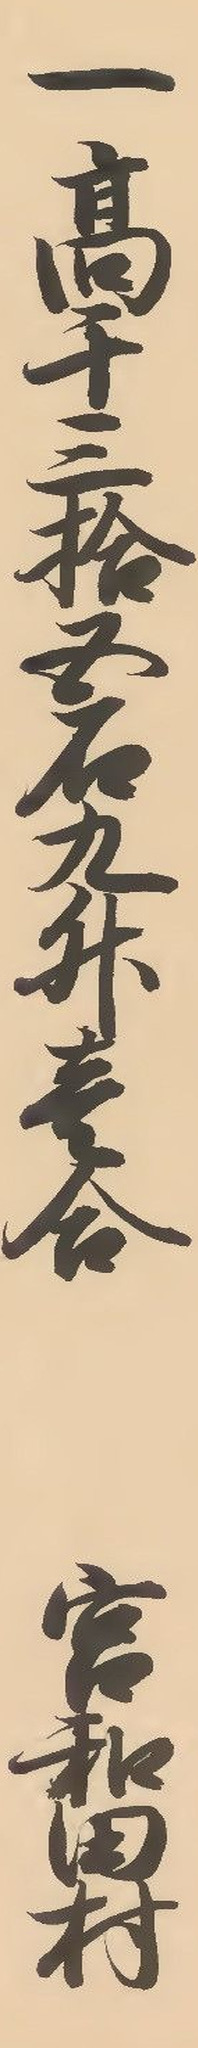一高千三拾五石九升壱合宮和田村
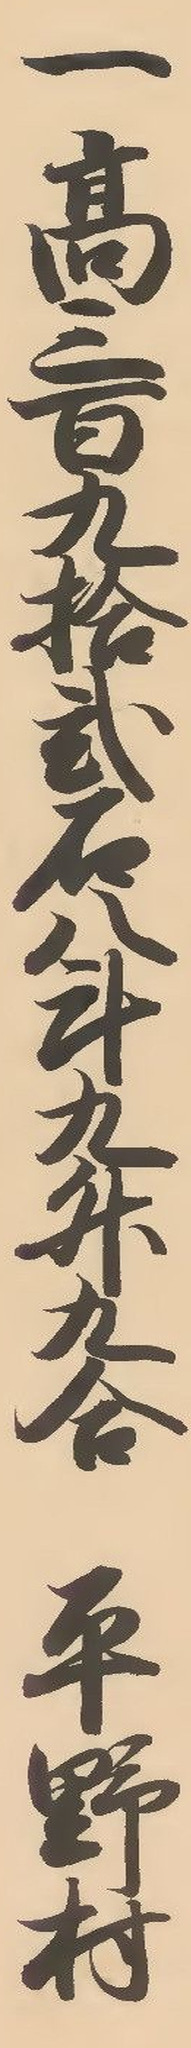一高三百九拾弐石八斗九升九合平野村
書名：下総国郷帳
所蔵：国立公文書館 National Archives of Japan
